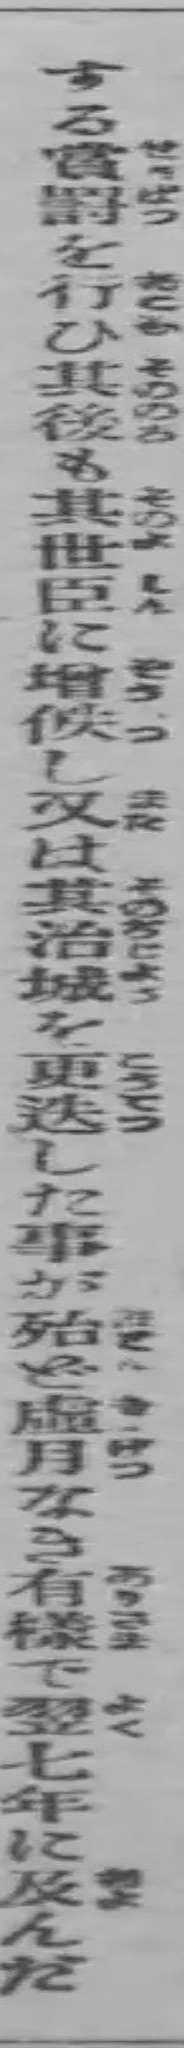する賞罰を行ひ其後も其世臣に増侯し又は其治城を更迭した事が殆ど虚月なき有様で翌七年に及んだ
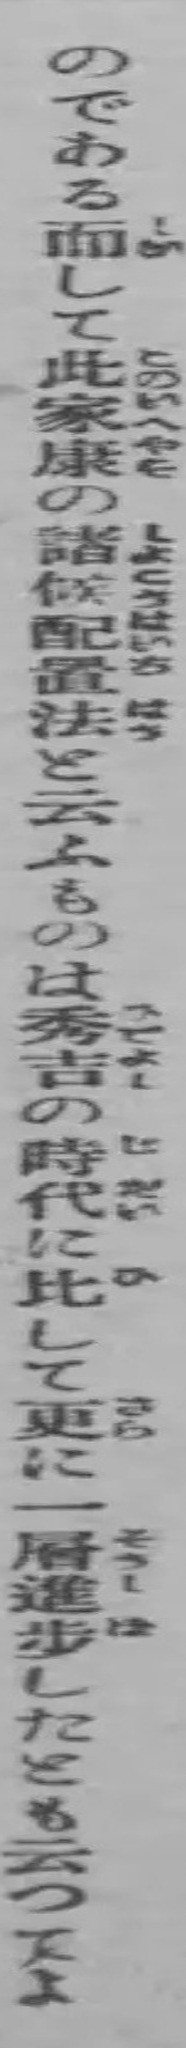のである而して此家康の諸侯配置法と云ふものは秀吉の時代に比して更に一層進歩したとも云つてよ
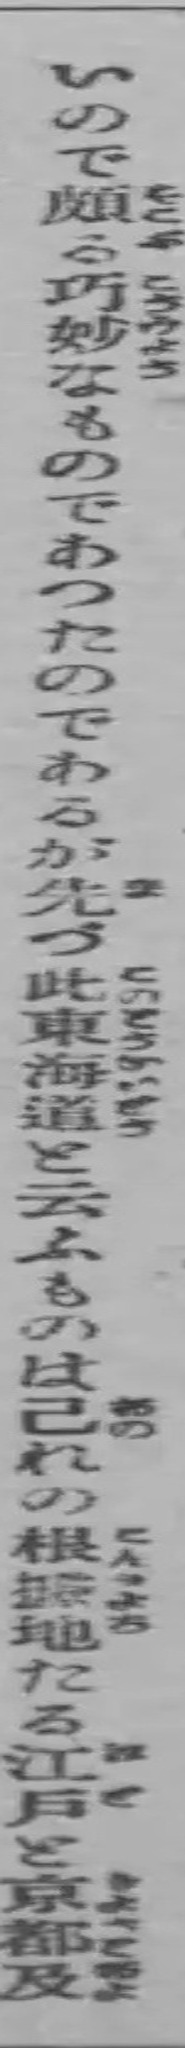いので頗る巧妙なものであつたのであるが先づ此東海道と云ふものは己れの根拠地たる江戸と京都及
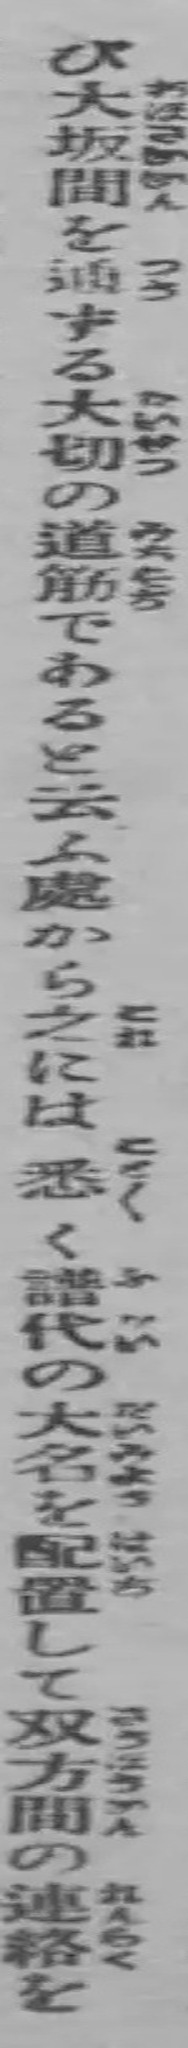び大坂間を通ずる大切の道筋であると云ふ処から之には悉く譜代の大名を配置して双方間の連絡を
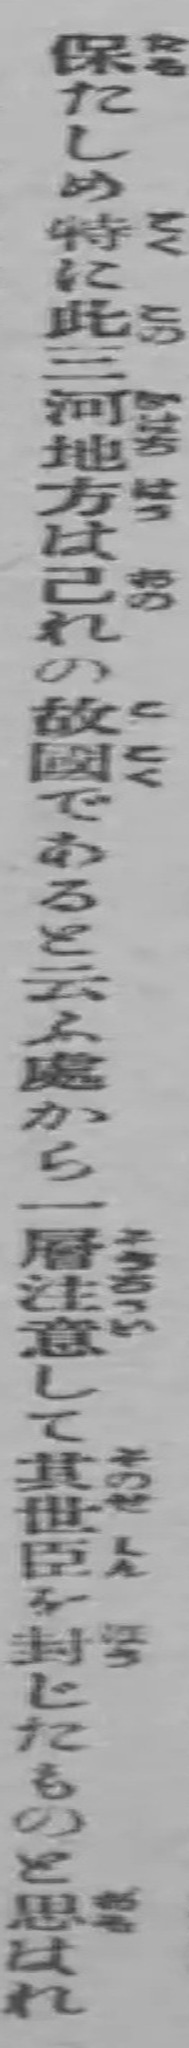保たしめ特に此三河地方は己れの故国であると云ふ処から一層注意して其世臣を封じたものと思はれ
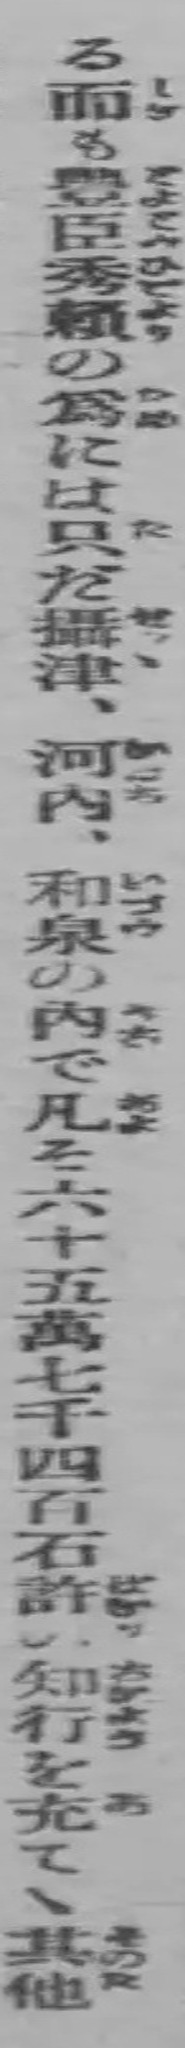る而も豊臣秀頼の為には只だ摂津、河内、和泉の内で凡そ六十五万七千四百石許の知行を充てゝ其他
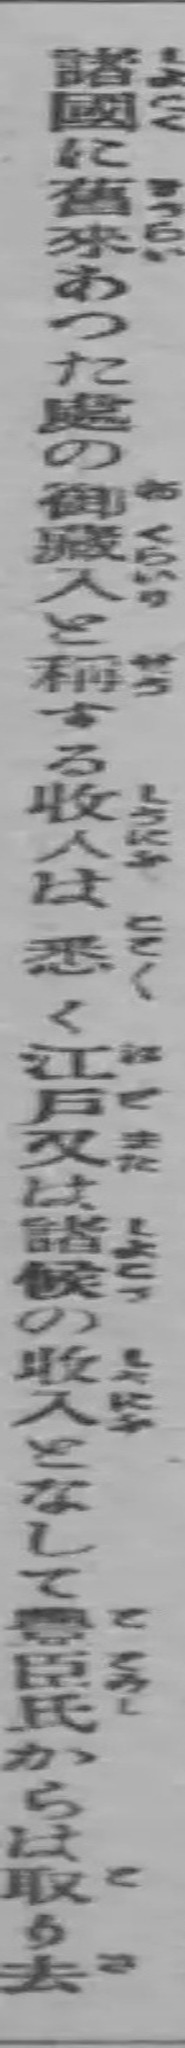諸国に旧来あつた処の御蔵入と称する収入は悉く江戸又は諸侯の収入となして豊臣氏からは取り去
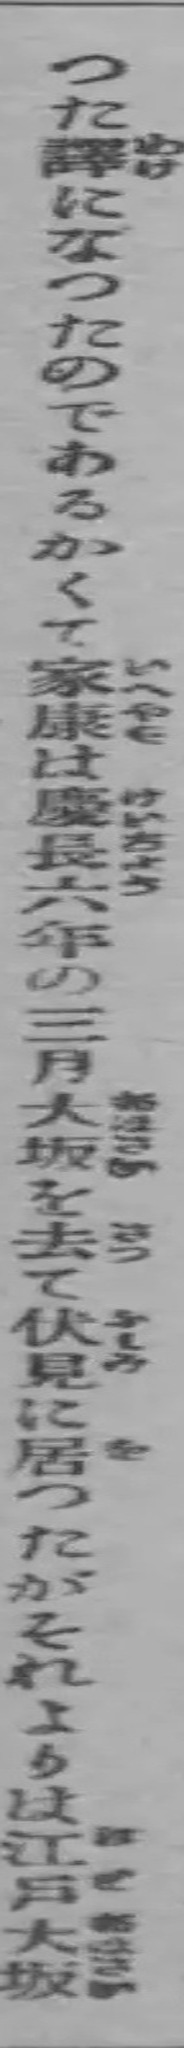つた訳になつたのであるかくて家康は慶長六年の三月大坂を去て伏見に居つたがそれよりは江戸大坂

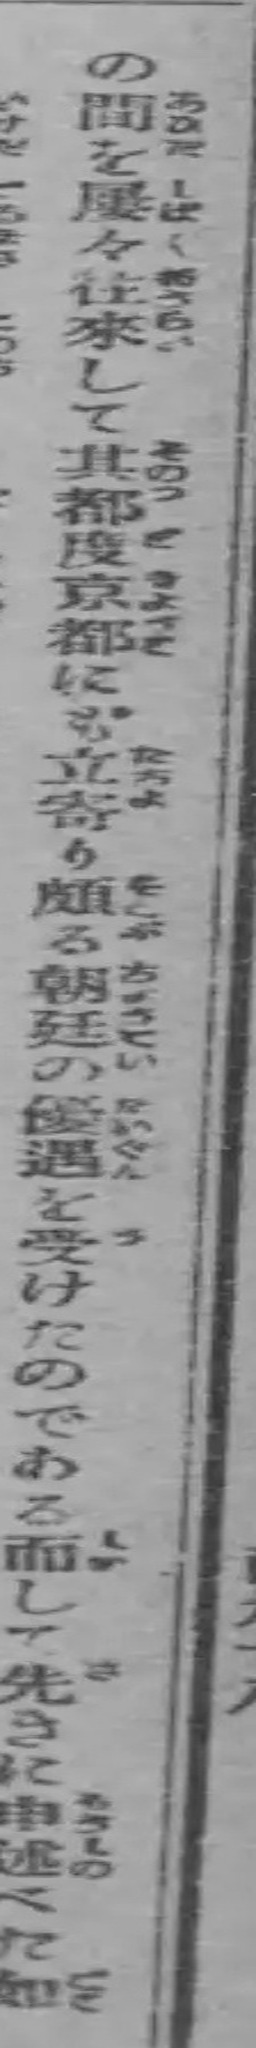の間を屡々往来して其都度京都にも立寄り頗る朝廷の優遇を受けたのである而して先きに申述べた如
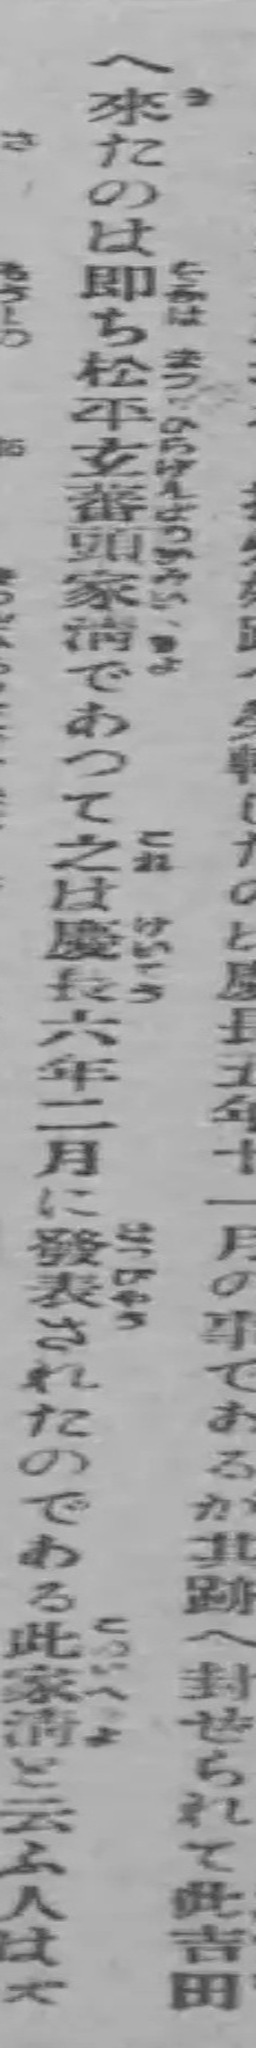へ来たのは即ち松平玄蕃頭家清であつて之は慶長六年二月に発表されたのである此家清と云ふ人はズ
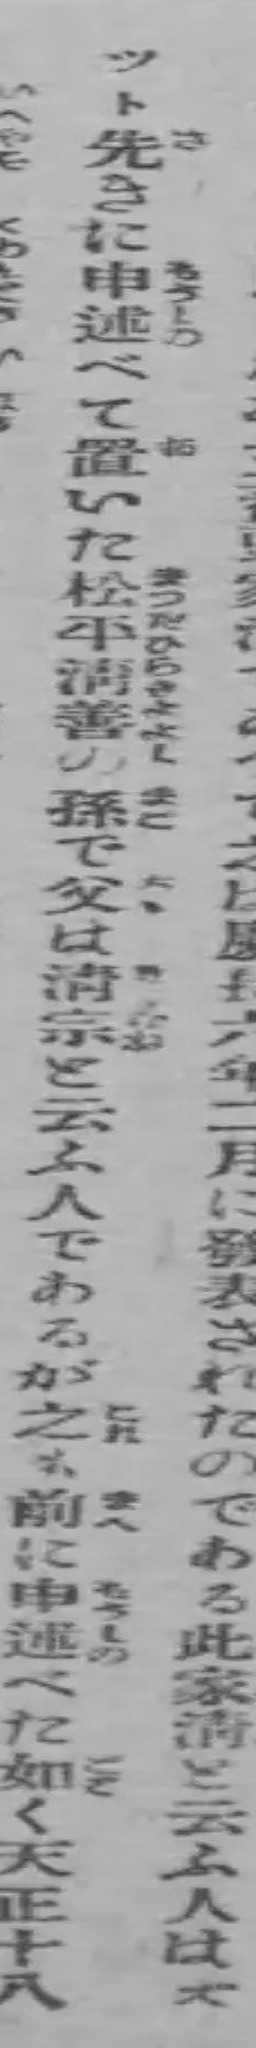ツト先きに申述べて置いた松平清善の孫で父は清宗と云ふ人であるが之も前に申述べた如く天正十八
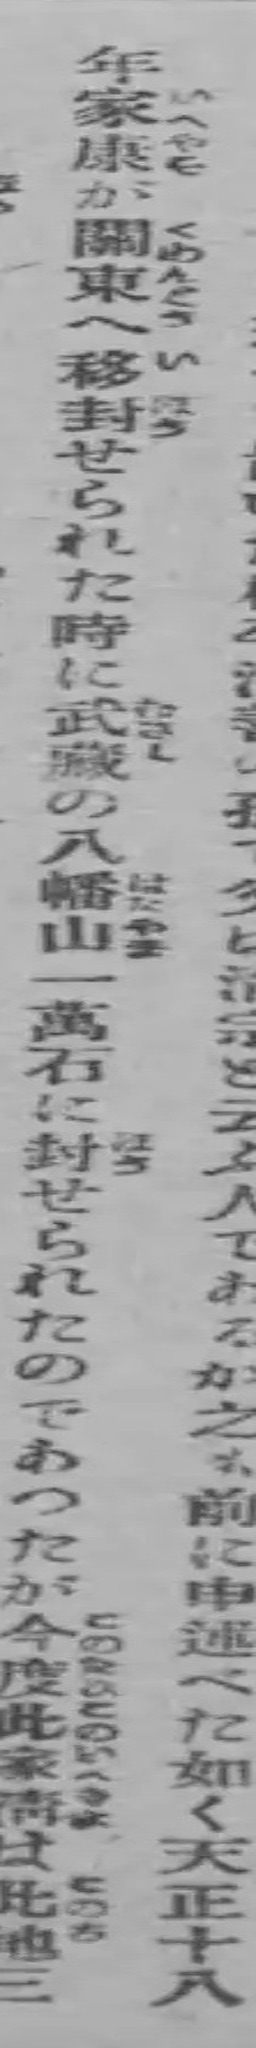年家康が関東へ移封せられた時に武蔵の八幡山一万石に封せられたのであつたが今度此家清は此地三
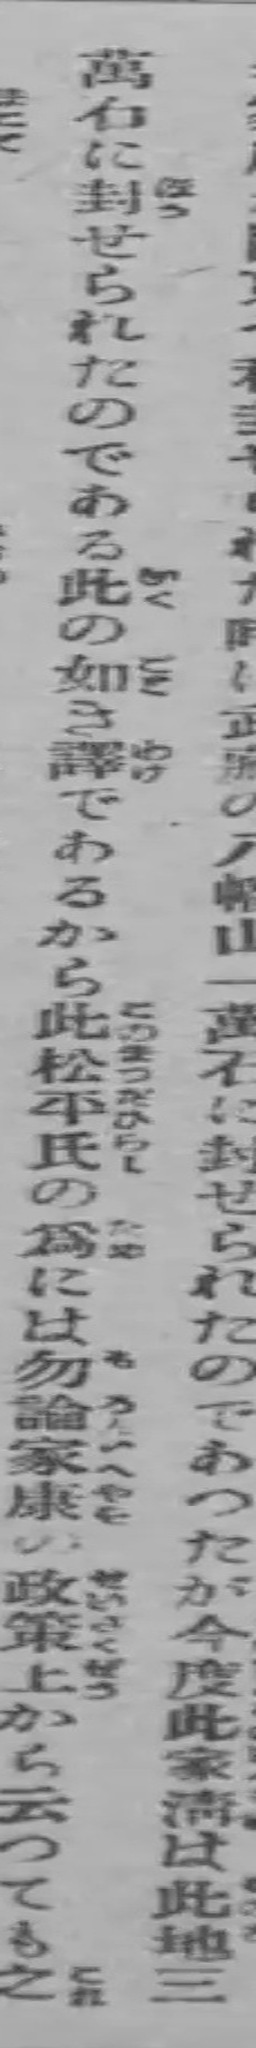万石に封せられたのである此の如き訳であるから此松平氏の為には勿論家康の政策上から云つても之
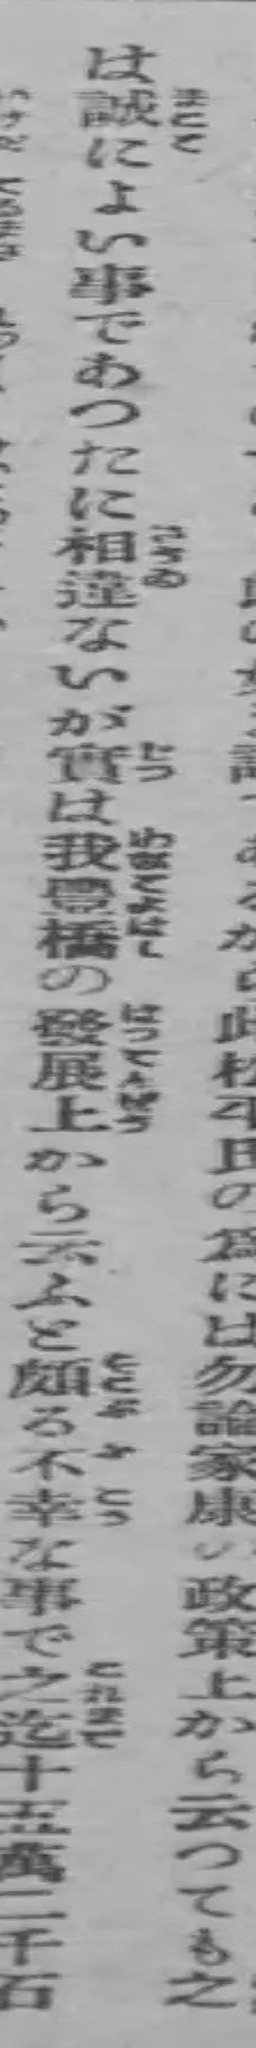は誠によい事であつたに相違ないが実は我豊橋の発展上から云ふと頗る不幸な事で之迄十五万二千石
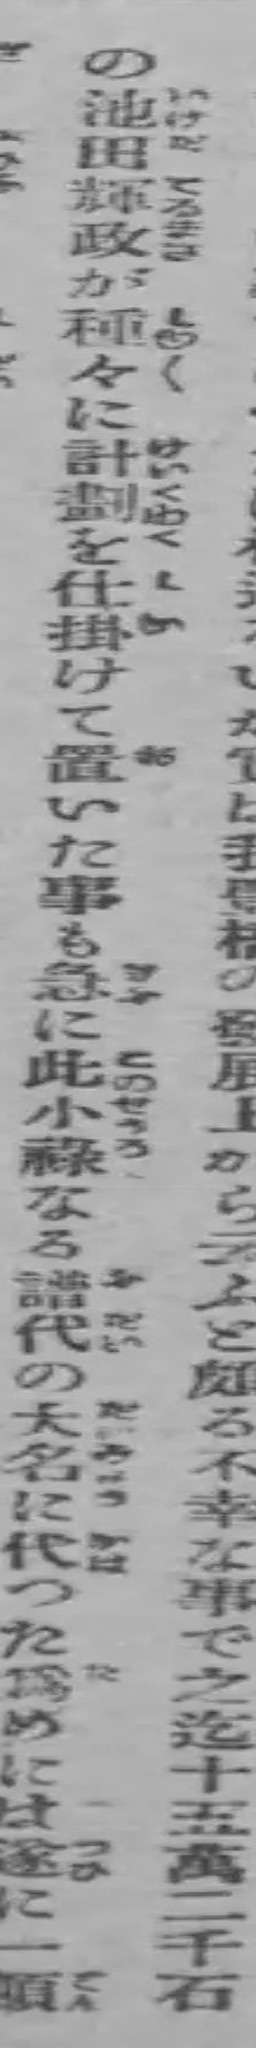土地の発展と藩主の池田輝政が種々に計割を仕掛けて置いた事も急に此小禄なる譜代の大名に代つた為に一頓
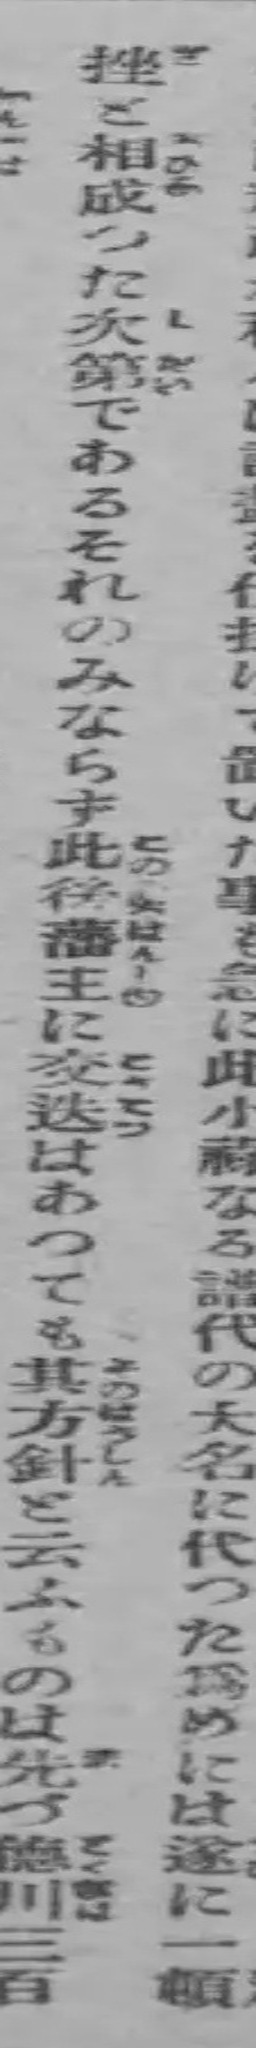挫と相成つた次第であるそれのみならず此後藩主に交迭はあつても其方針と云ふものは先づ徳川三百
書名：豊橋市史談
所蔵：国立国会図書館 National Diet Library, JAPAN
